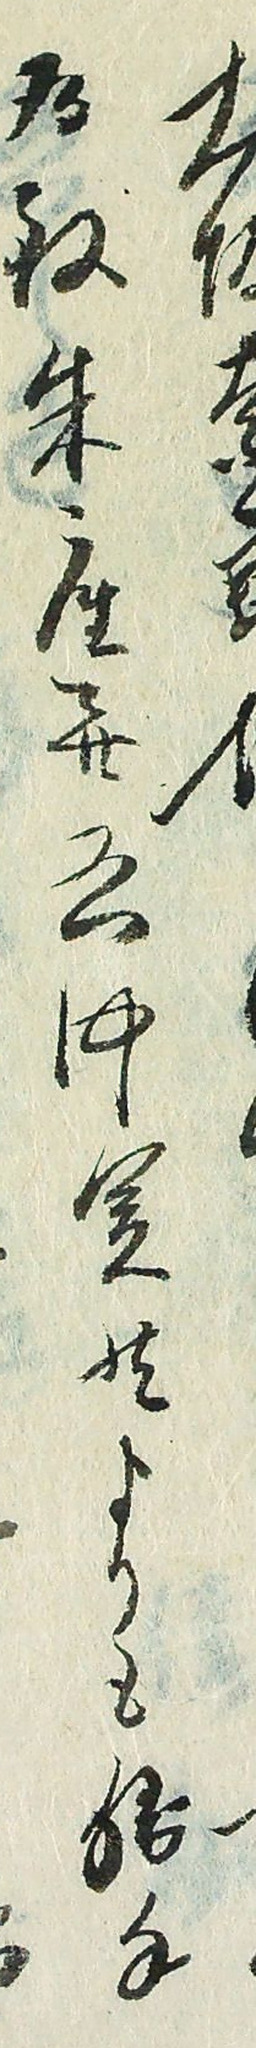為致朱座幷右仲買共よりも勝手
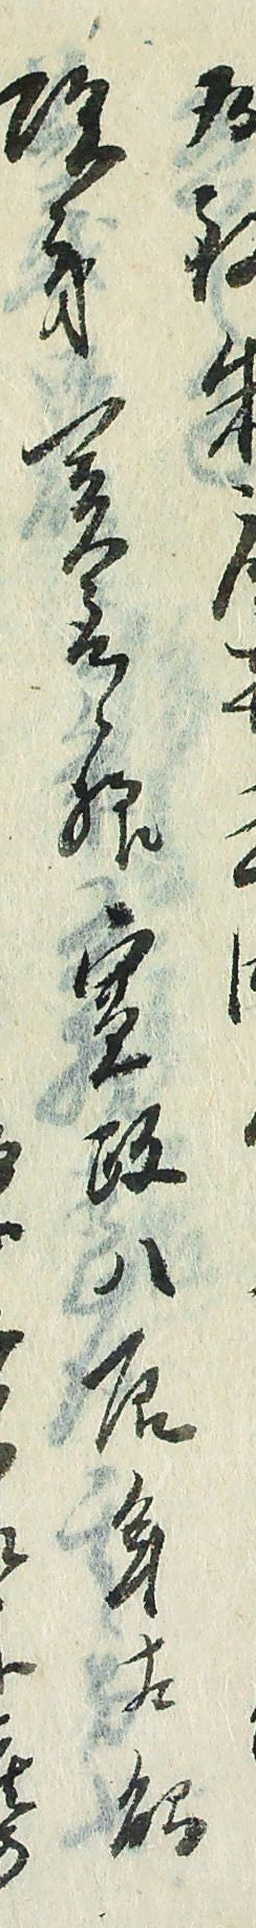次第買取候様寬政八辰年相触
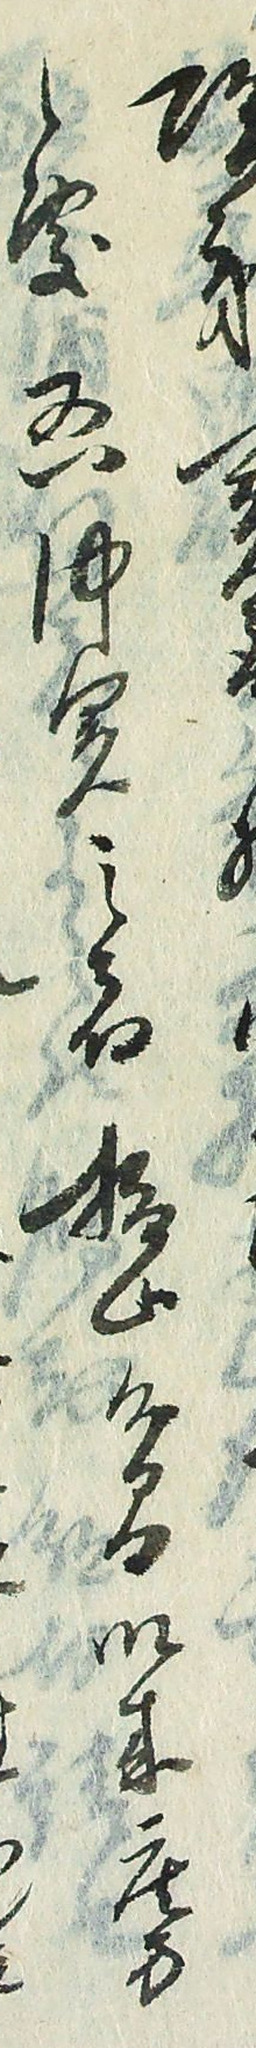候処右仲買之者指止候間以来座方
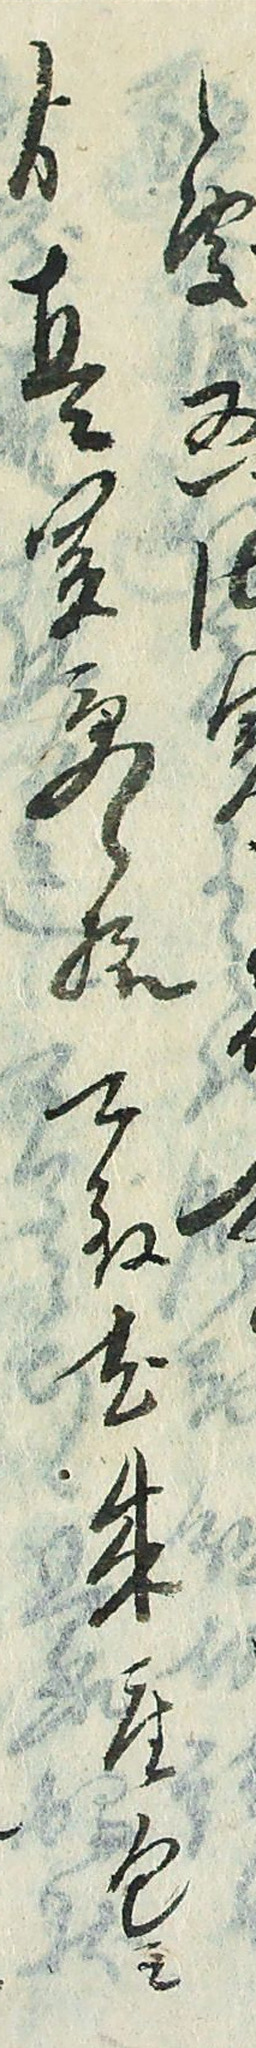ゟ直に買受候様可致尤朱座包之
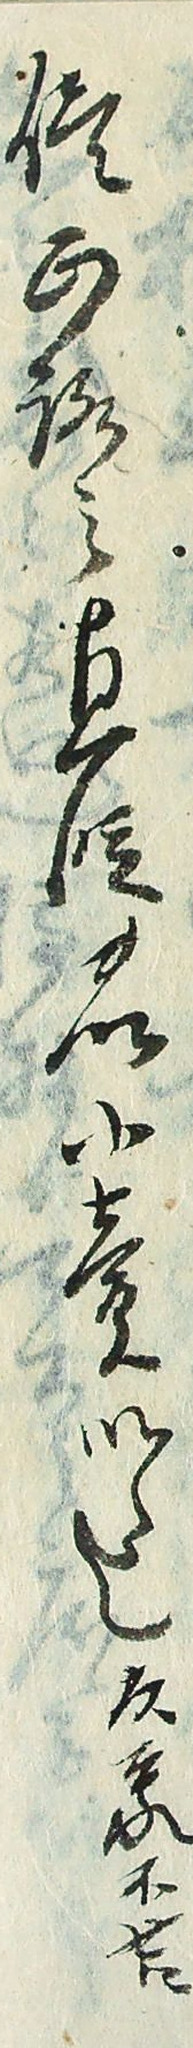侭正路之直段を以小売いたし候義不苦

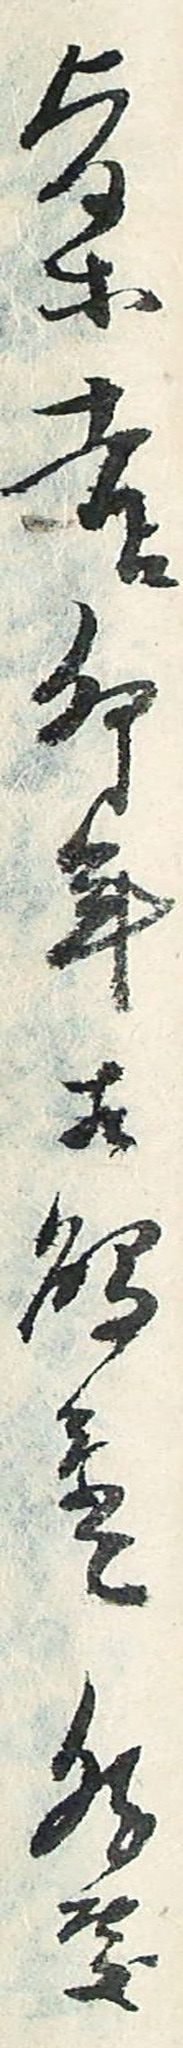旨等去る卯年相触置候然処
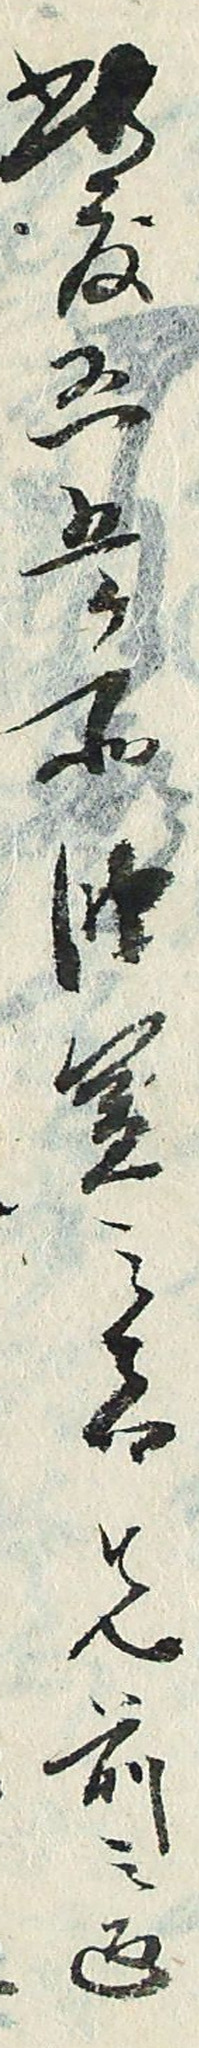此度右五ケ所仲買之者先前之通
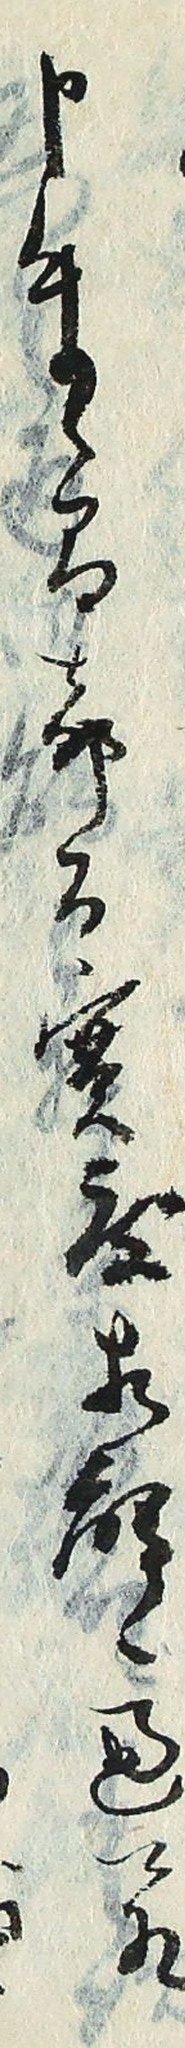申付候間都而寬度相触候通可相
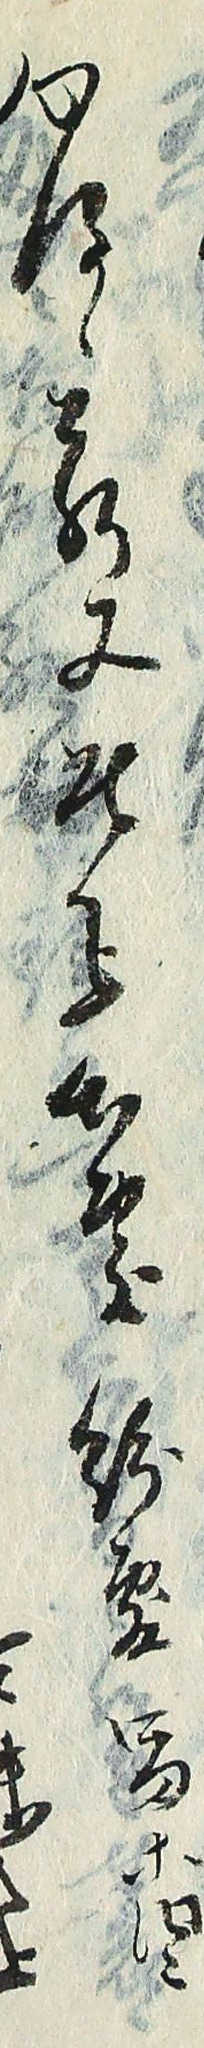心得候若又此上出処紛敷品等内々
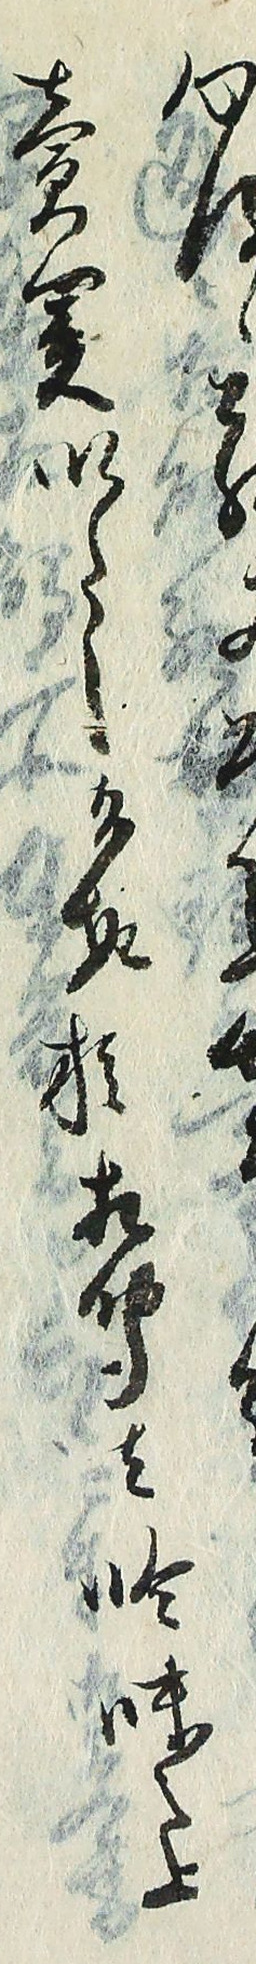売買いたし候段於相聞は吟味之上
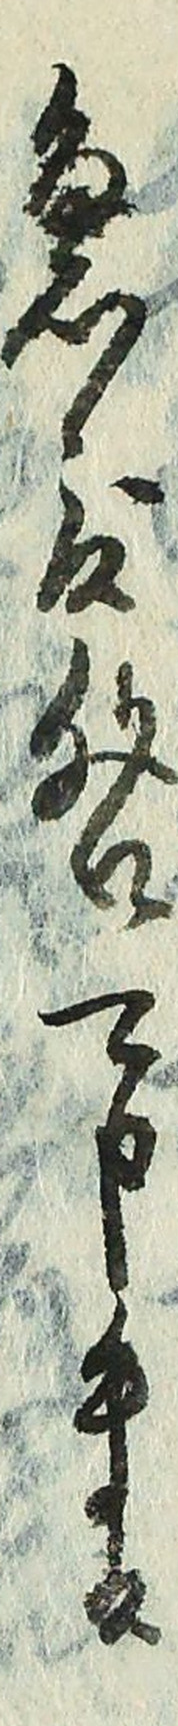急度咎可申付候
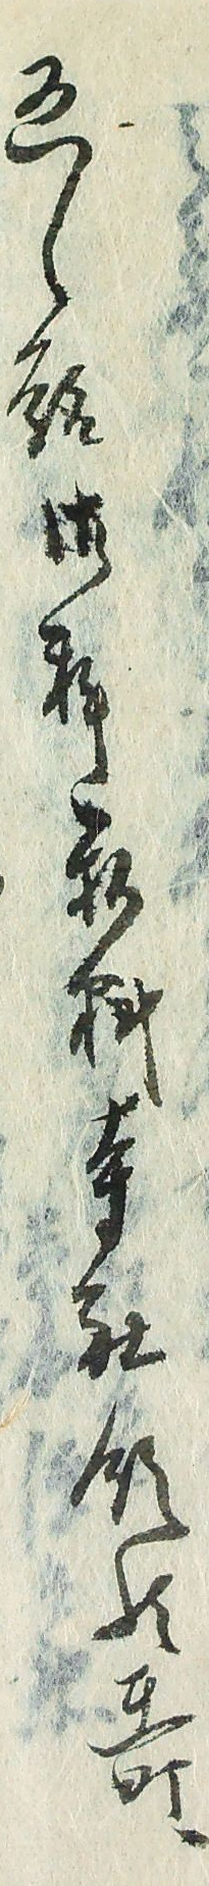右之趣御料私料寺社領在町へ
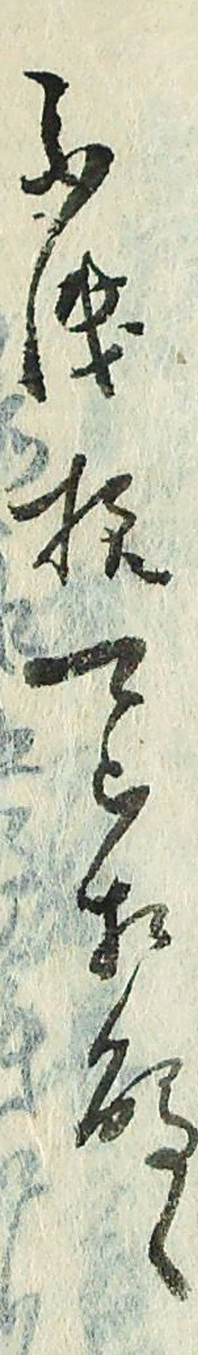不洩様可相触候
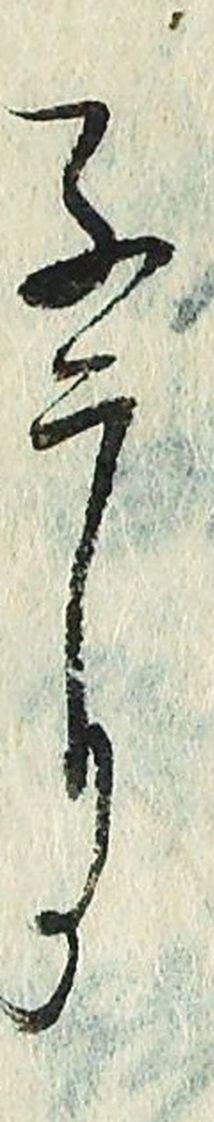子二月
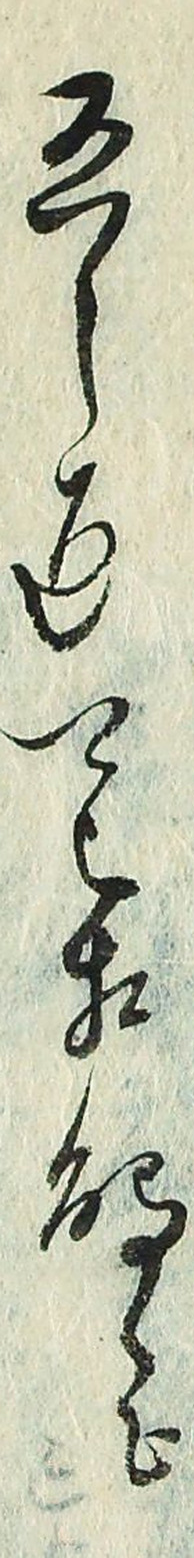右之通可被相触候以上
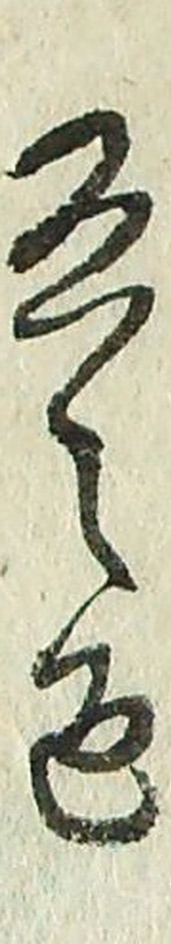右之通
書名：諸御用御□受書控
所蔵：鳴門教育大学 Naruto University of Education
